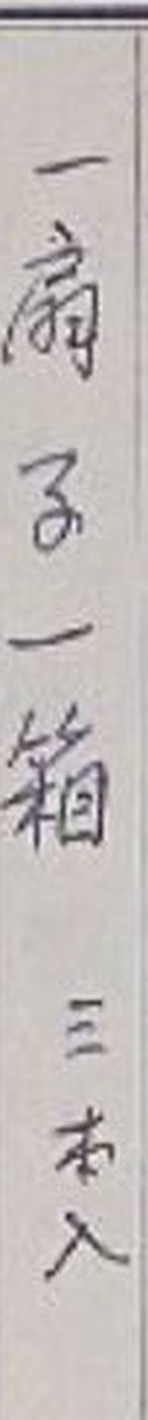一扇子一箱三本入一形付手拭一筋
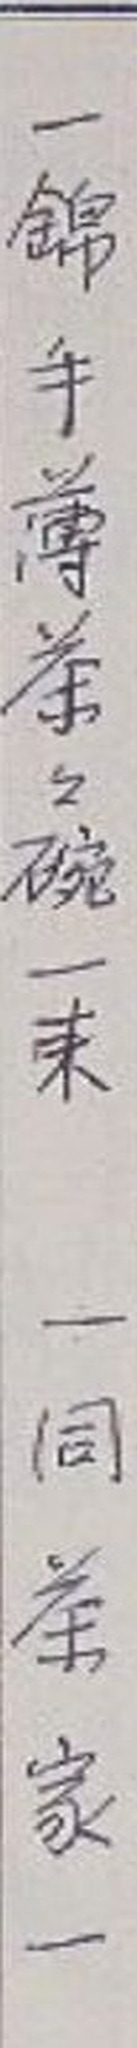一錦手薄茶々碗一束一同茶家一
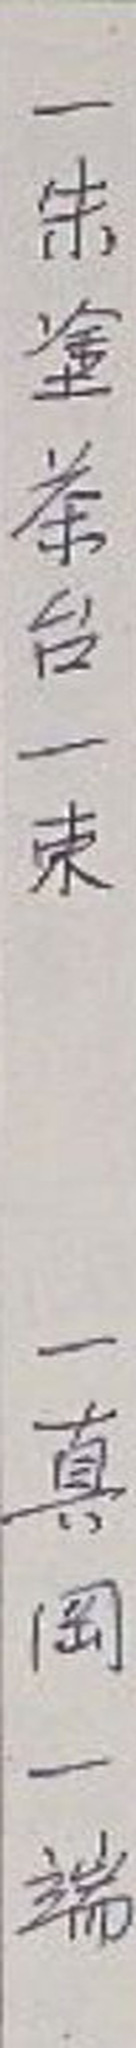一朱塗茶台一束一真岡一端
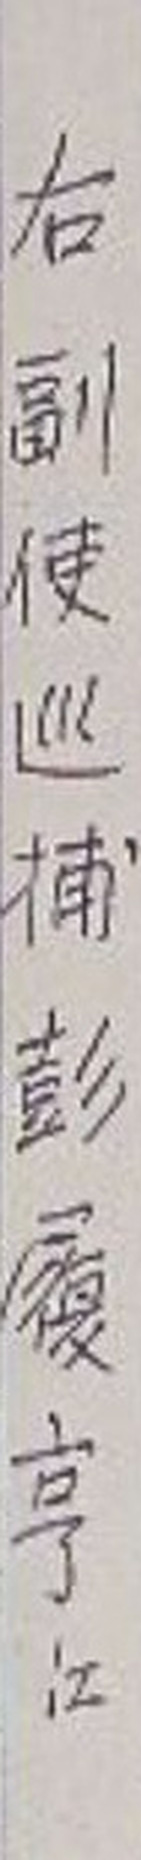右副使巡捕彭履亨え
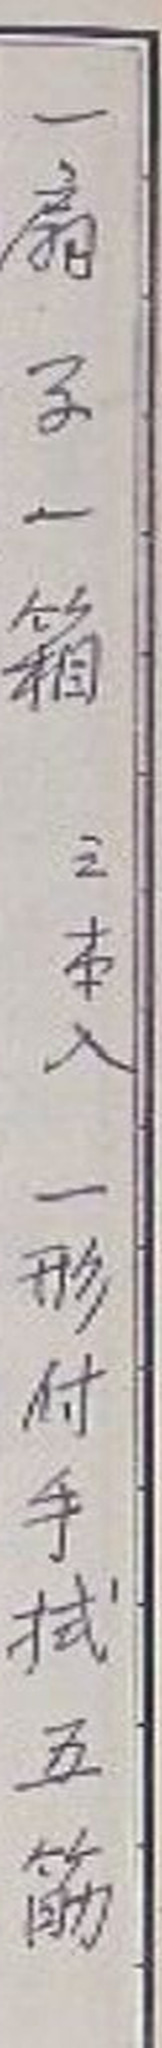一扇子一箱三本入一形付手拭五筋
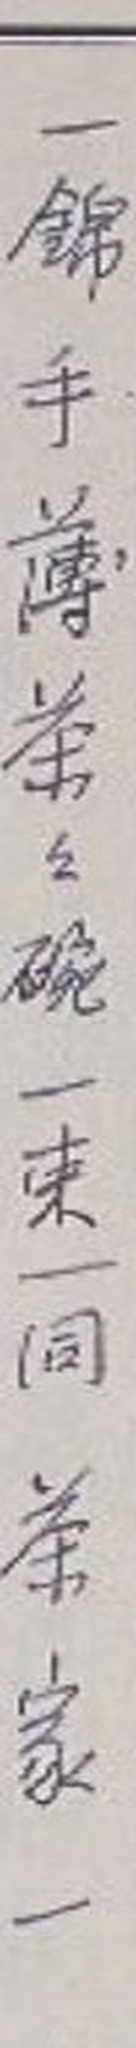一錦手薄茶々碗一束一同茶家一
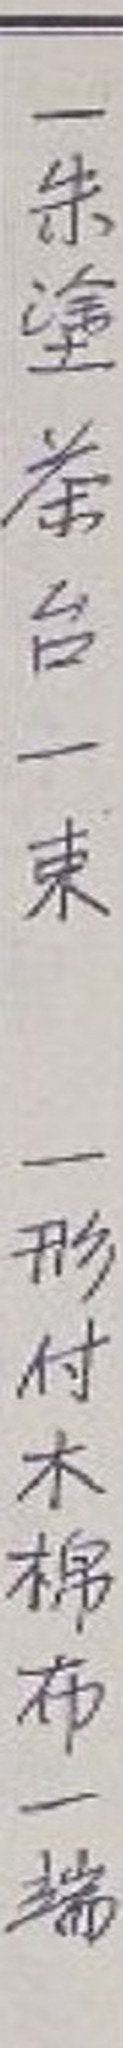一朱塗茶台一束一形付木棉布一端
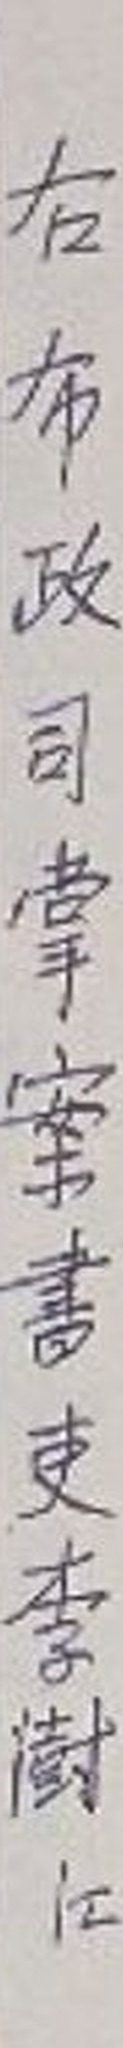右布政司掌案書吏李澍え
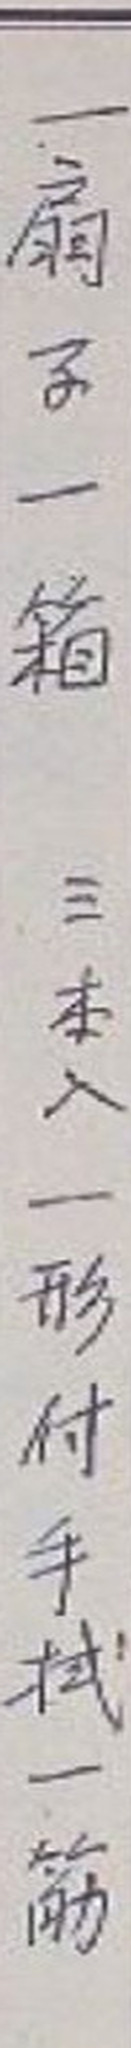一扇子一箱三本入一形付手拭一筋
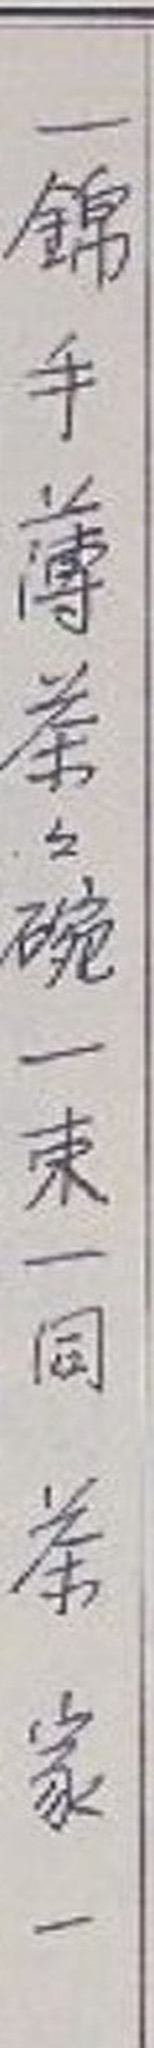一錦手薄茶々碗一束一同茶家一
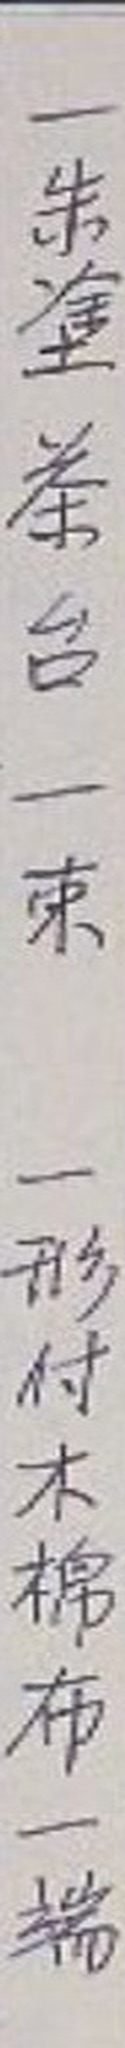一朱塗茶台一束一形付木棉布一端
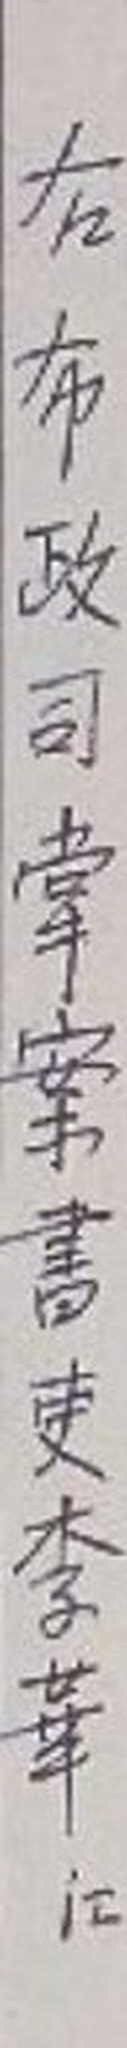右布政司掌案書吏李華え
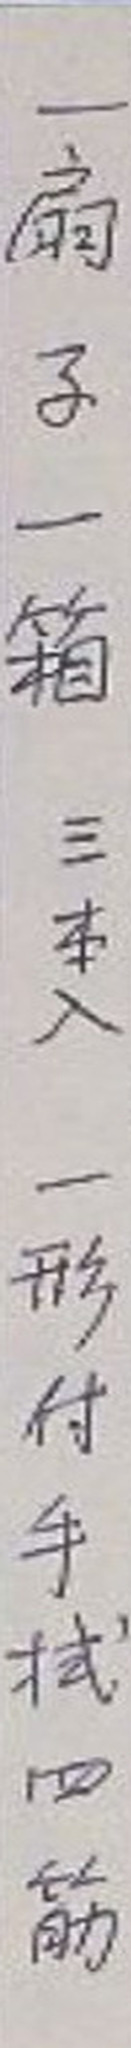一扇子一箱三本入一形付手拭四筋
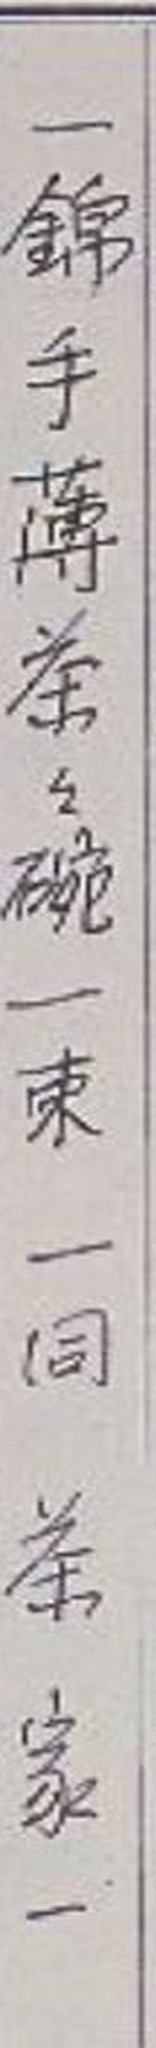一錦手薄茶々碗一束一同茶家一
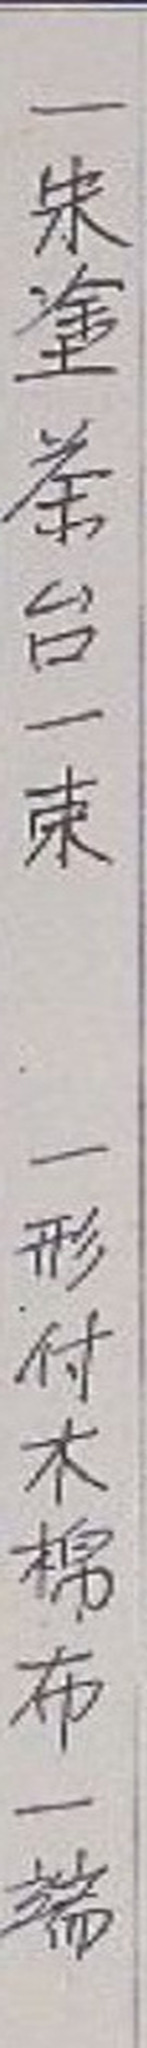一朱塗茶台一束一形付木棉布一端
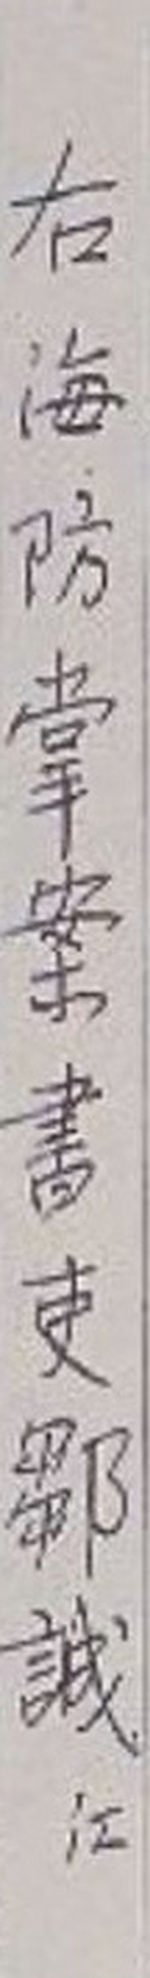右海防掌案書吏鄒誠え
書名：支那冊封使来琉諸記 下巻
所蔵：University of the Ryukyus Library
